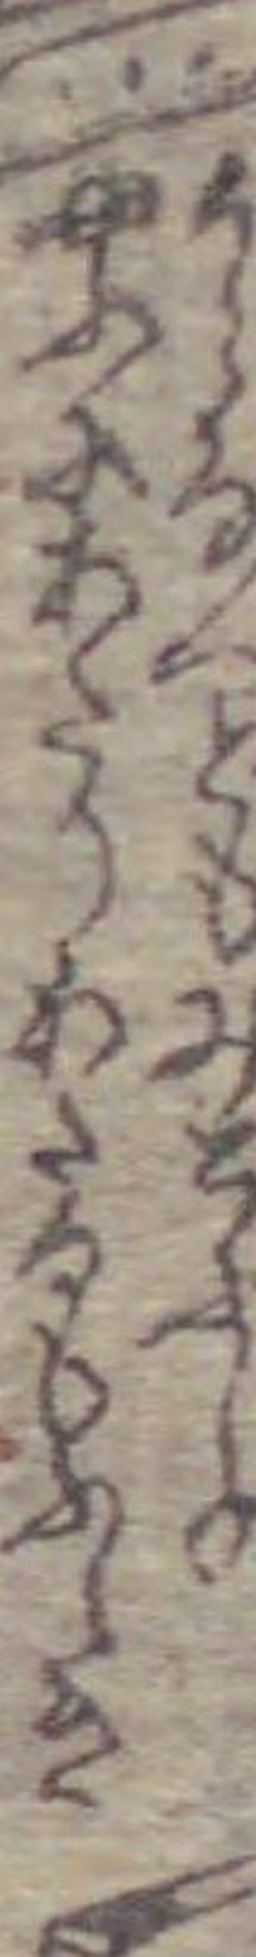やふにあたりあたるもふしき
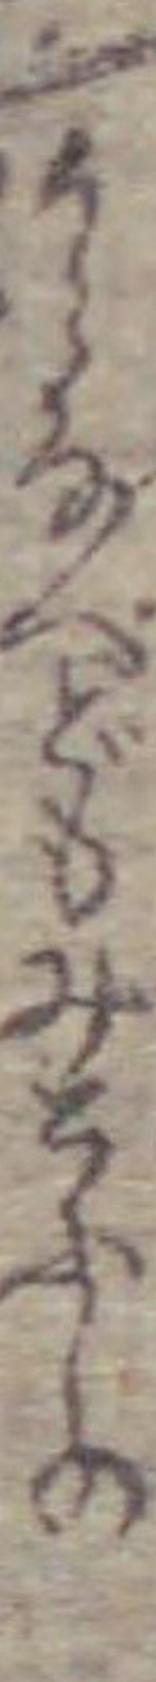うらなへどもみとふしの
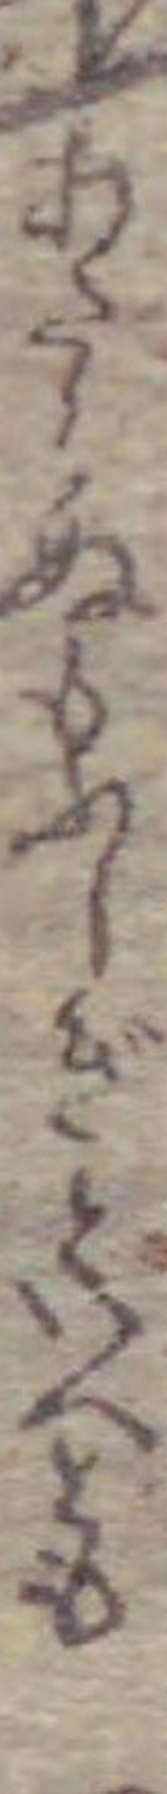あたらぬもふしぎといへとも
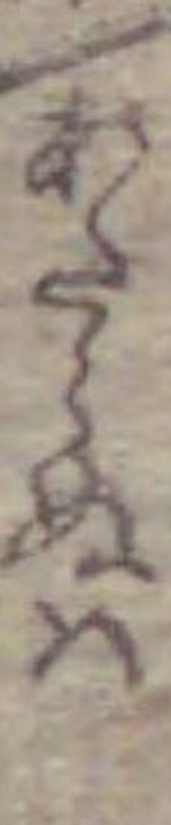あたらぬは
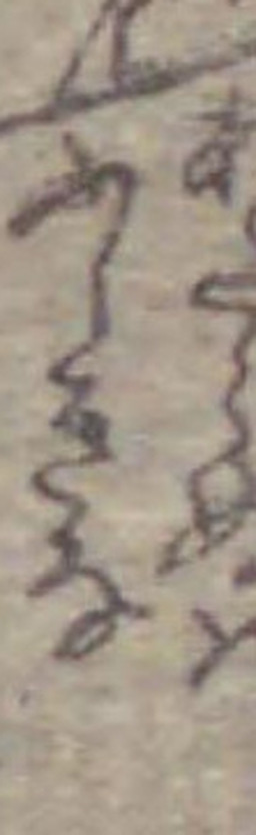ふしきな
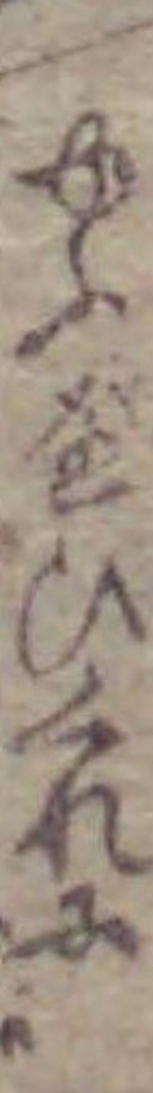ゆふべひくれに
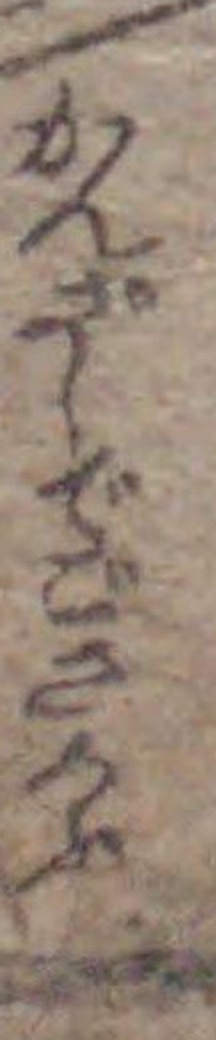かんざしでごさろふ
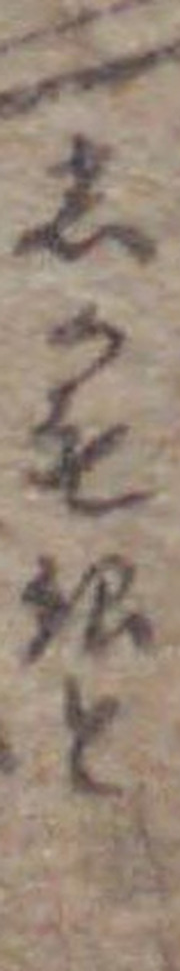しかも銀と

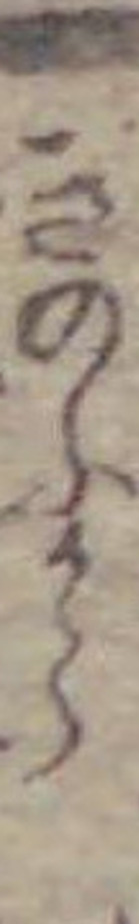きのふから
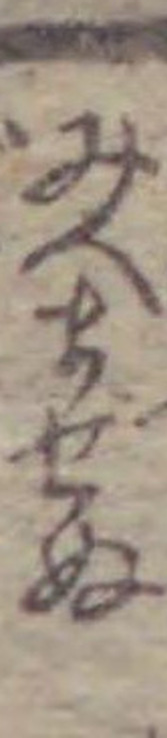みへませぬ
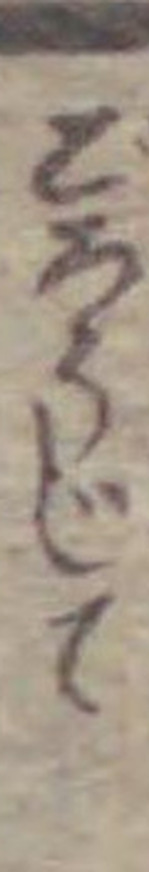ごろうじて
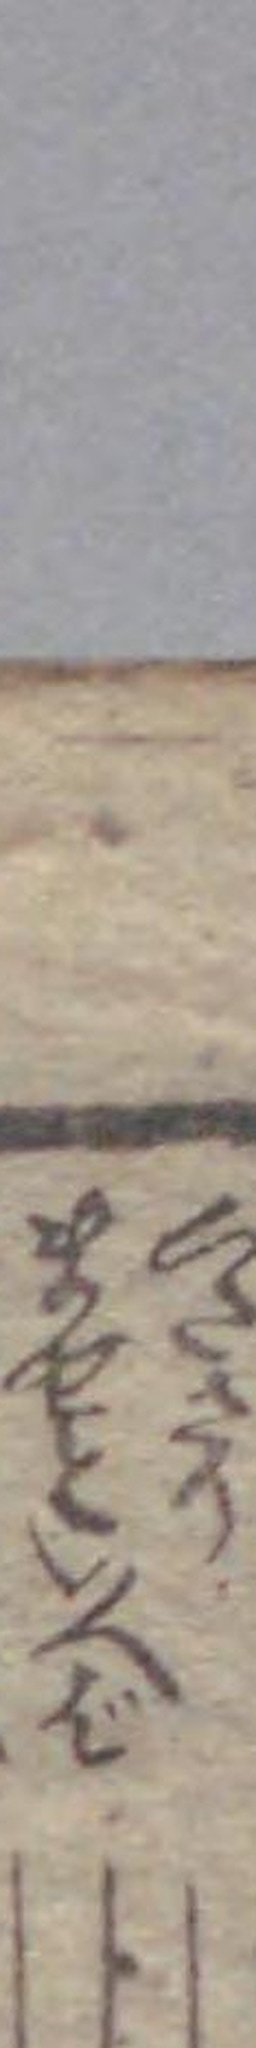ませといへば
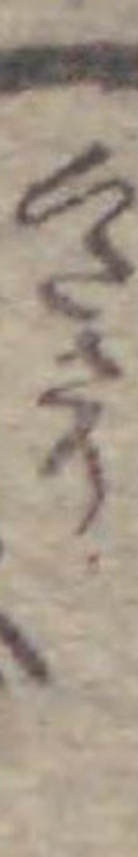くたさり
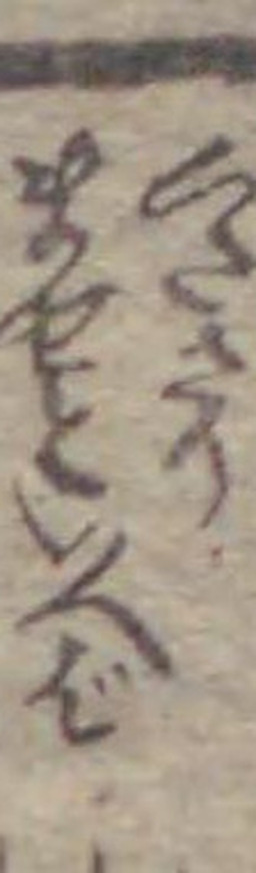ませといへば
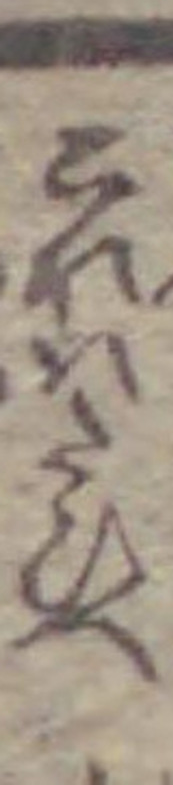これはたひへ
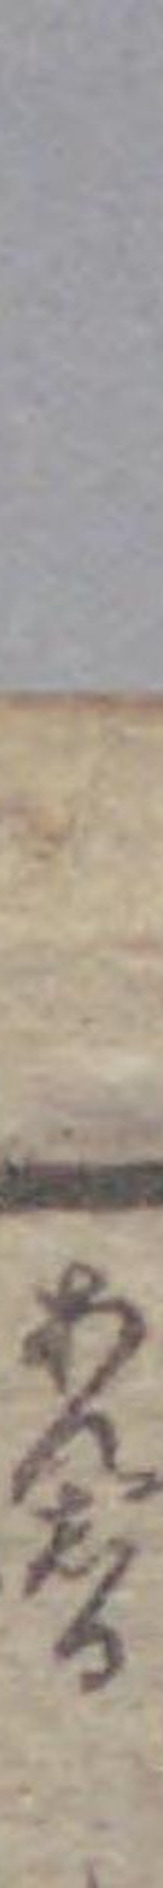あんしる
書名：見通占 : 3巻
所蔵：国立国会図書館 National Diet Library, JAPAN
